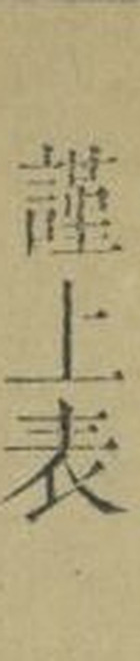謹上表
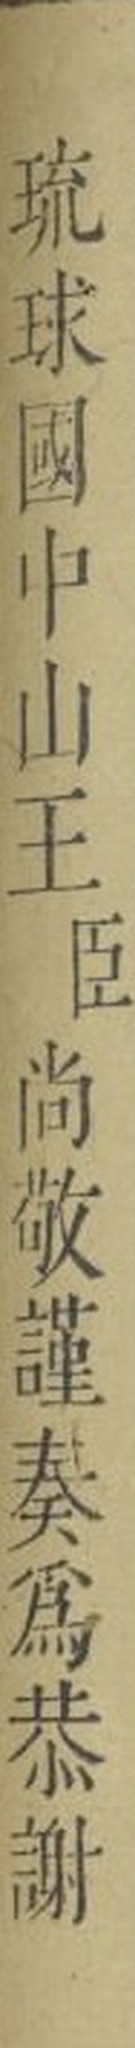琉球國中山王臣尚敬謹奏爲恭謝
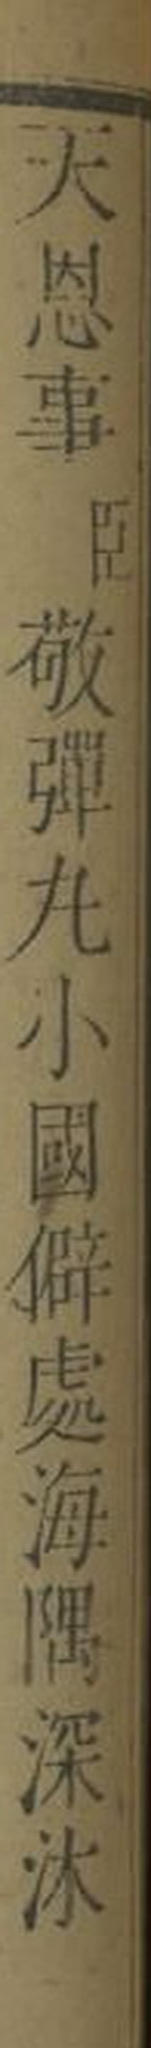天恩事臣敬彈丸小國僻處海隅深沐
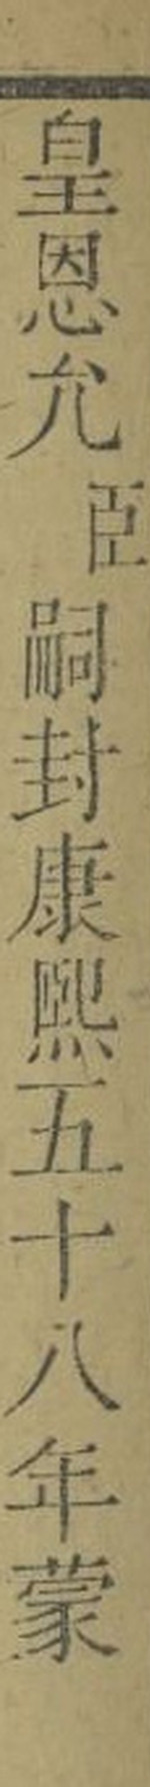皇恩允臣嗣封康煕五十八年蒙
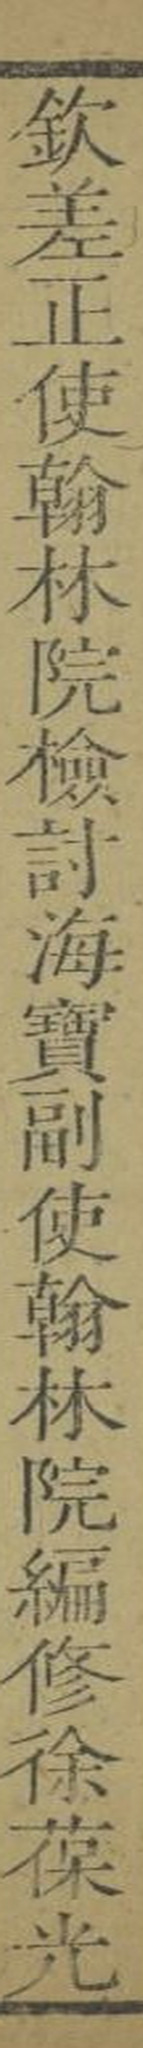欽差正使翰林院檢討海寶副使翰林院編修徐葆光
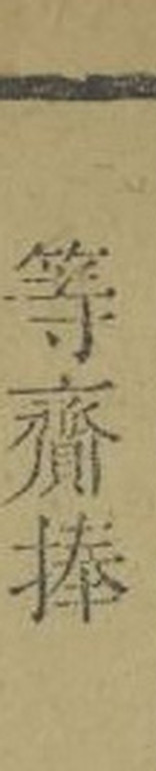等齎捧
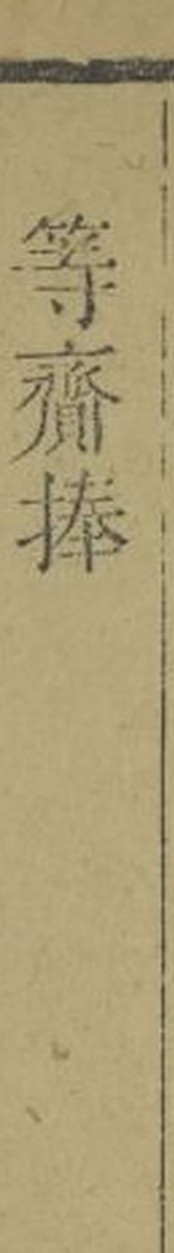等齎捧
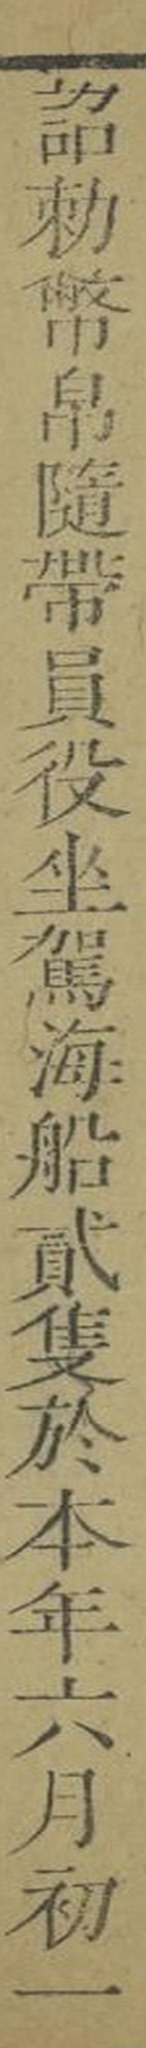詔勅幣帛隨帶員役坐駕海船貳隻於本年六月初一
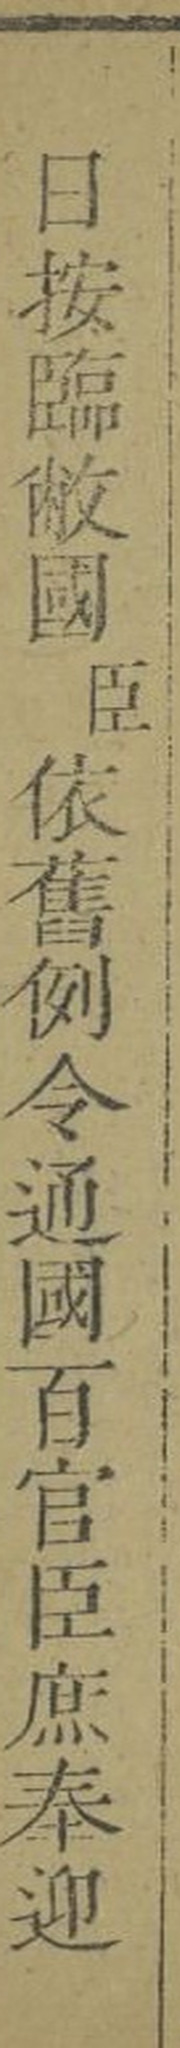日按臨敝國臣依舊例令通國百官臣庶奉迎
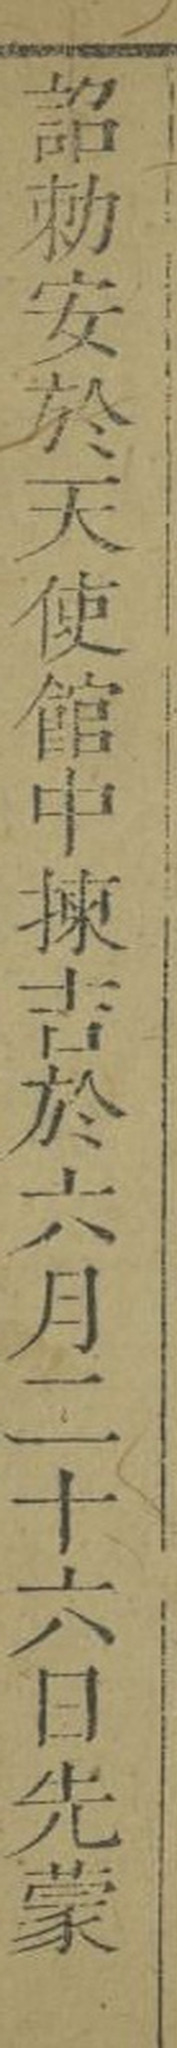詔勅安於天使館中揀吉於六月二十六日先蒙
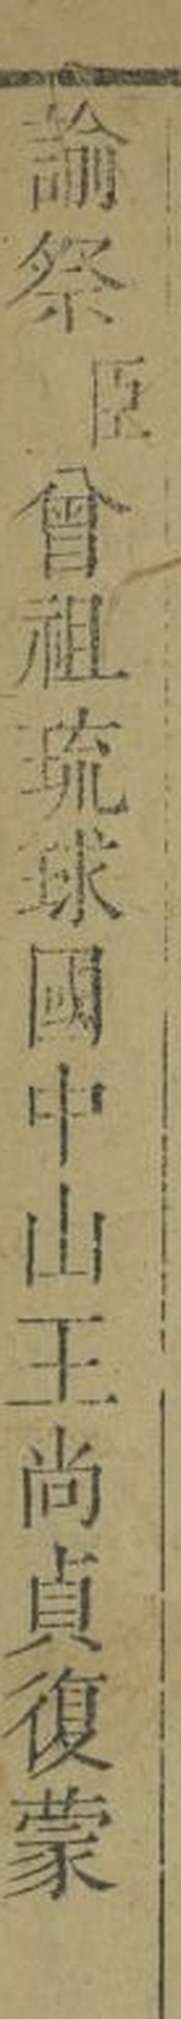諭祭臣曾祖琉球國中山王尚貞復蒙
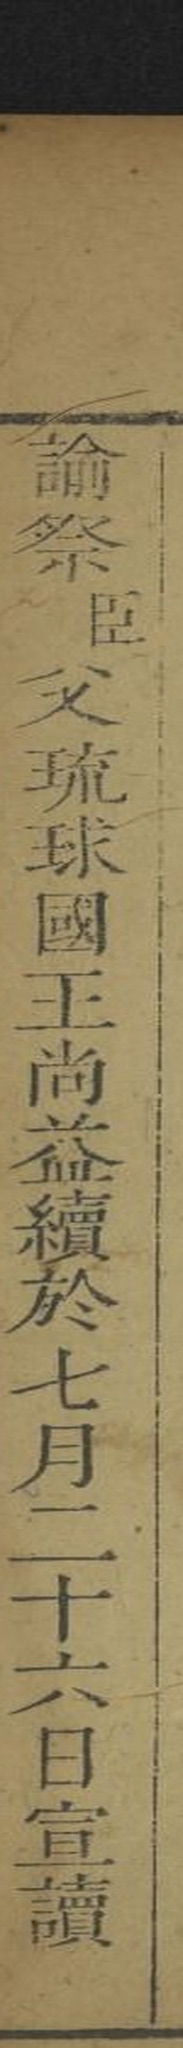諭祭臣父琉球國王尚益續於七月二十六日宣讀
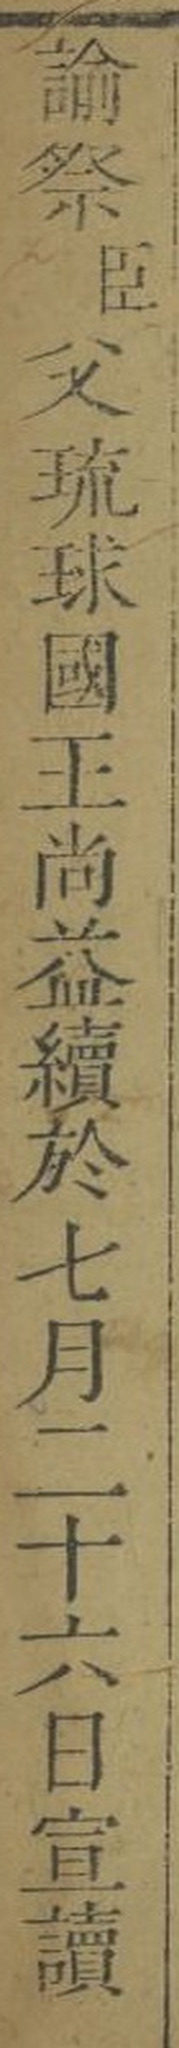諭祭臣父琉球國王尚益續於七月二十六日宣讀

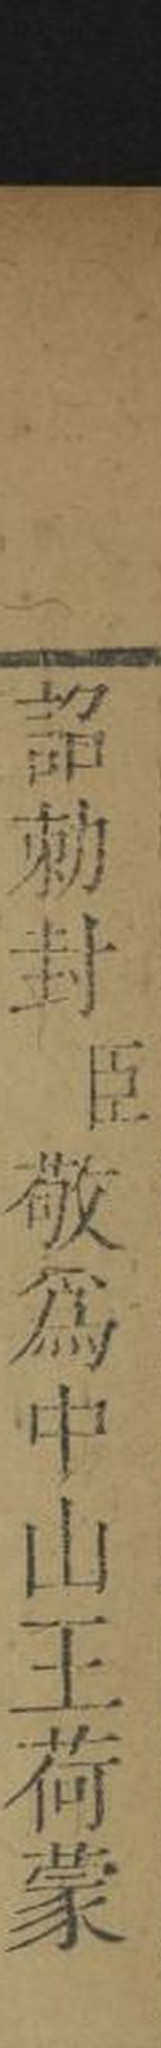詔勅封臣敬爲中山王荷蒙
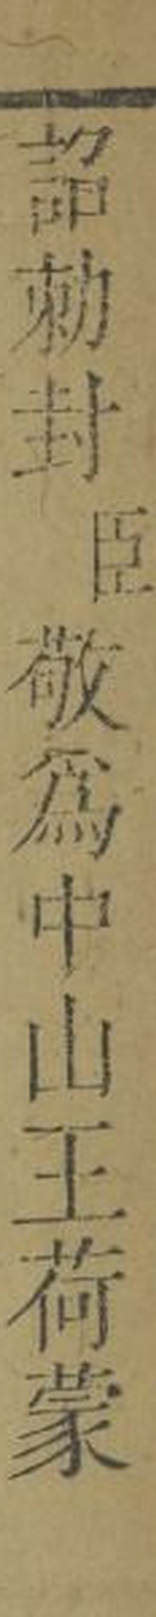詔勅封臣敬爲中山王荷蒙
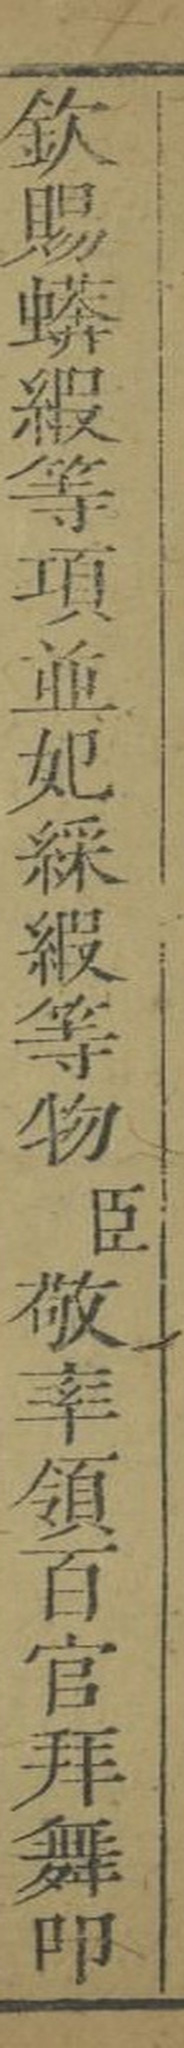欽賜蠎縀等項並妃綵縀等物臣敬率領百官拜舞叩
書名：中山伝信録 巻二
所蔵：University of the Ryukyus Library
